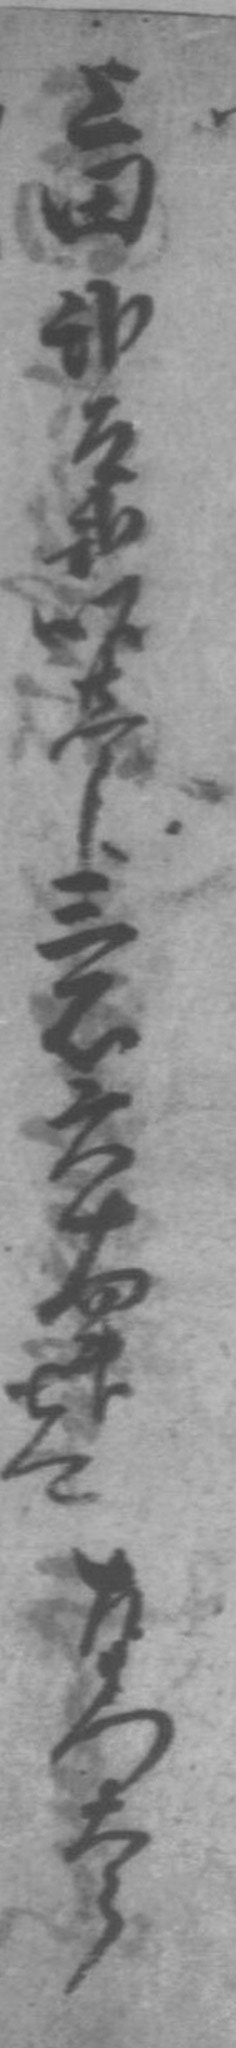上田弐反弐畝廿一分三石六斗四升七合左衛門太郎
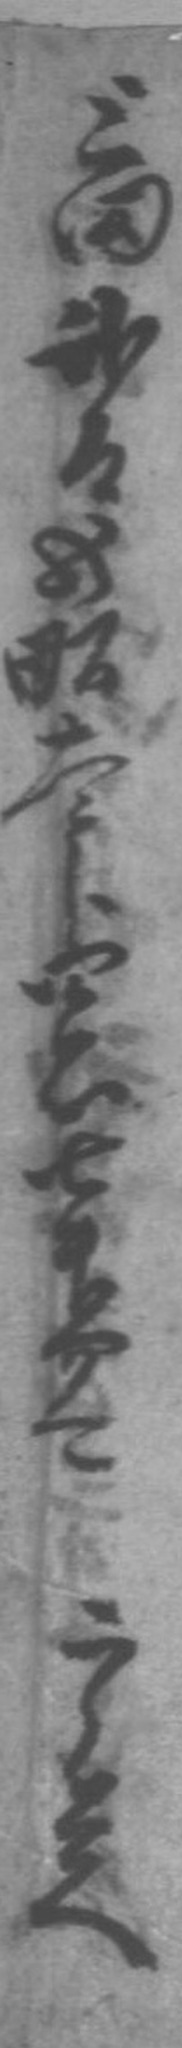上田弐反五畝十一分四石七升四合二郎兵へ
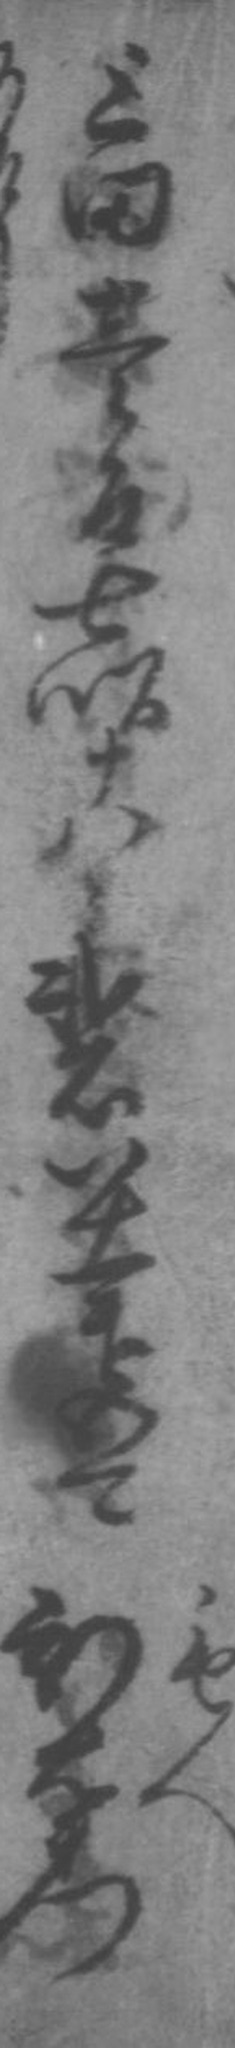上田壱反七畝十八分弐石八斗一升五合新右衛門

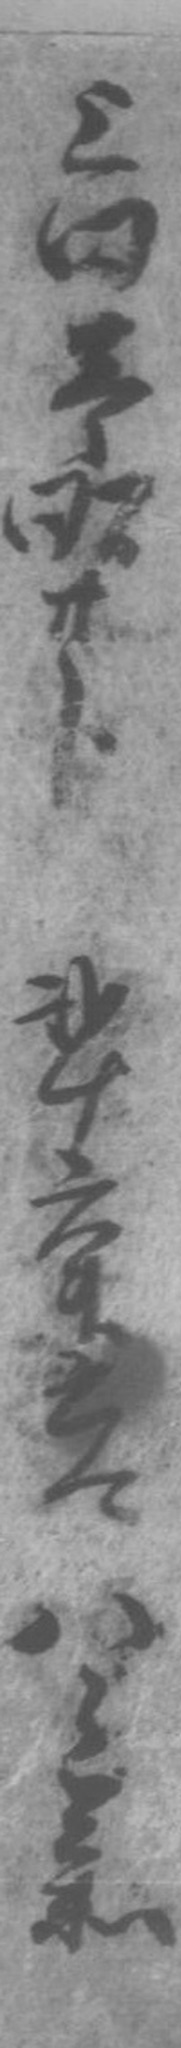上田壱畝廿分弐斗六升六合八郎兵衛
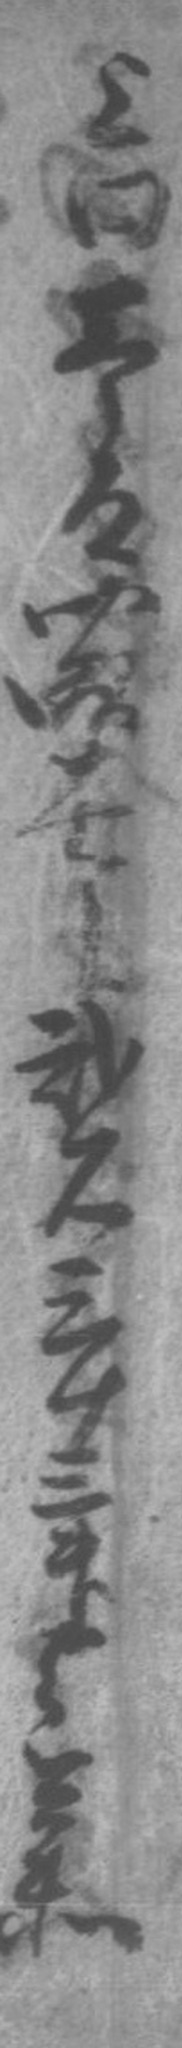上田壱反四畝十七分弐石三斗三升与兵衛
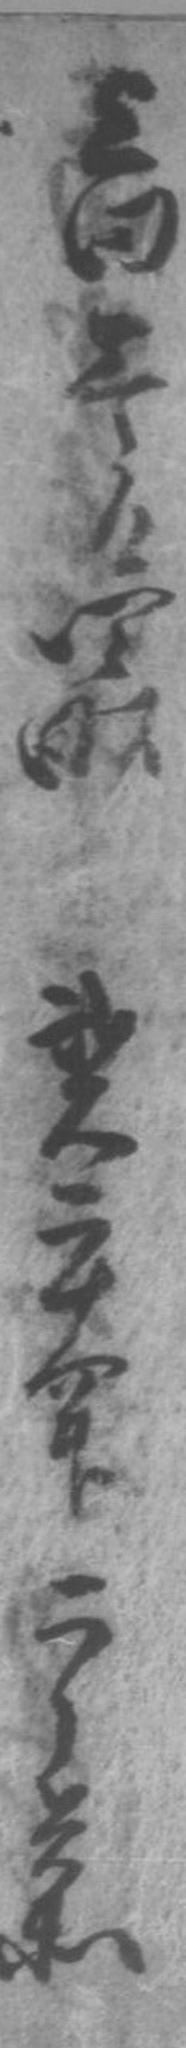上田壱反四畝弐石二斗四升二郎兵衛
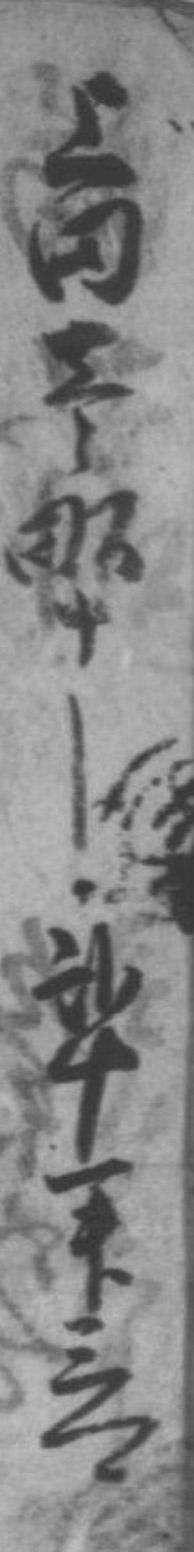上田壱畝十分弐斗一升三合同人
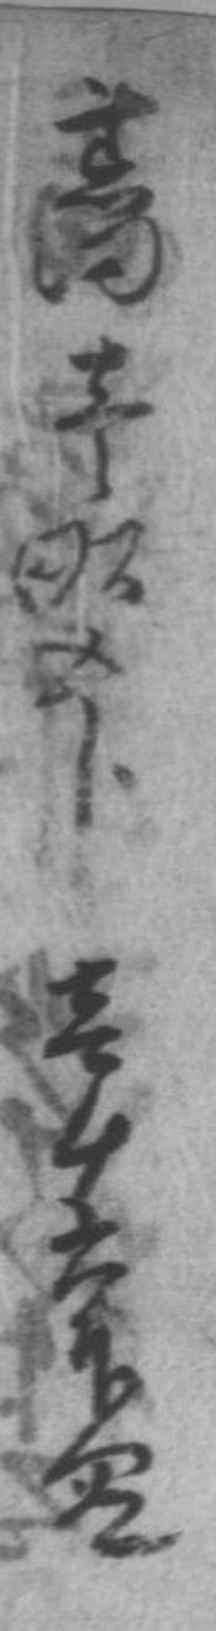荒田壱畝五分壱斗六升四合無主
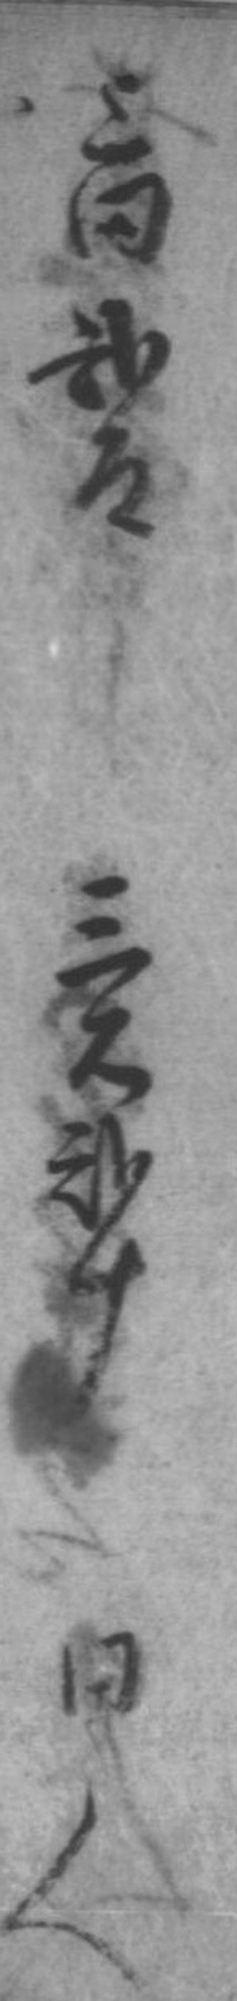上田弐反三石弐斗同人
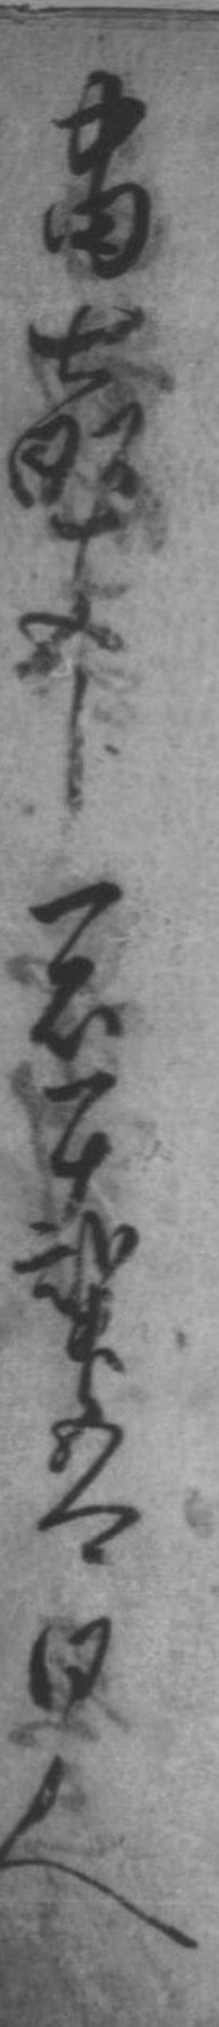中田七畝十五歩一石一斗弐升五合同人

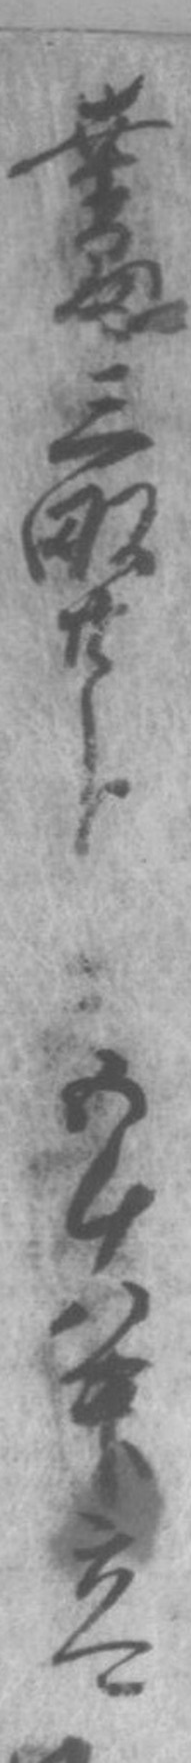桑畠三畝廿分五斗八升六合同人
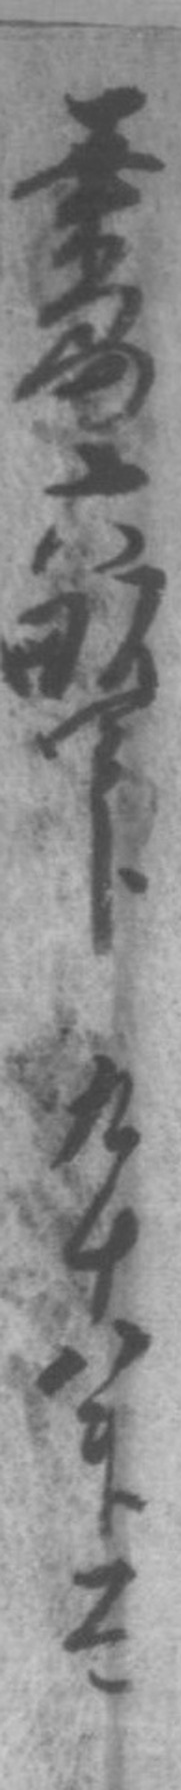桑畠六畝四分九斗八升一合彦三郎
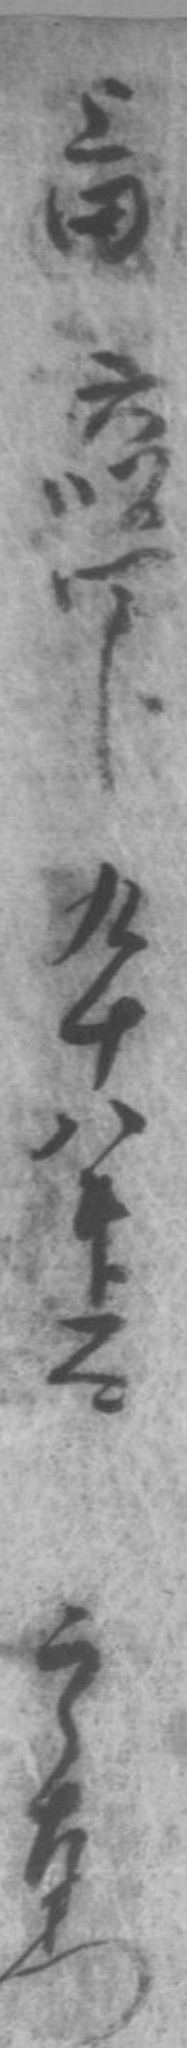上田六畝四分九斗八升一合二郎左衛門
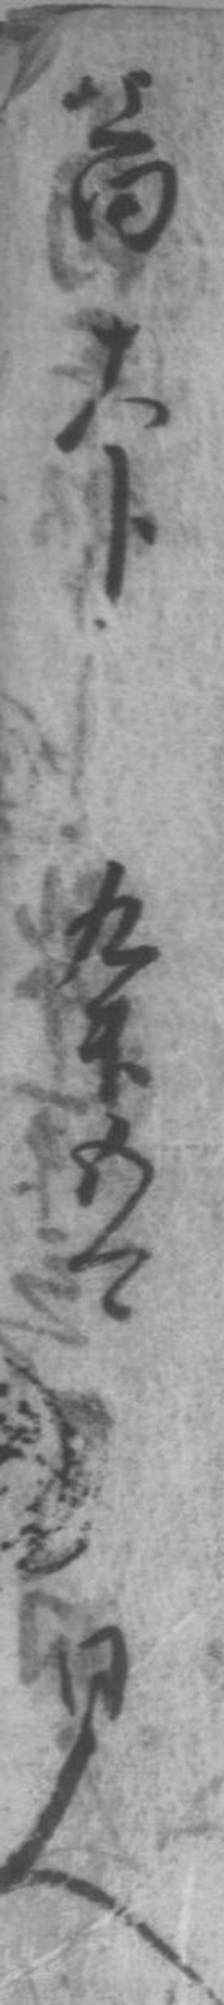上田十八分九升五合同人
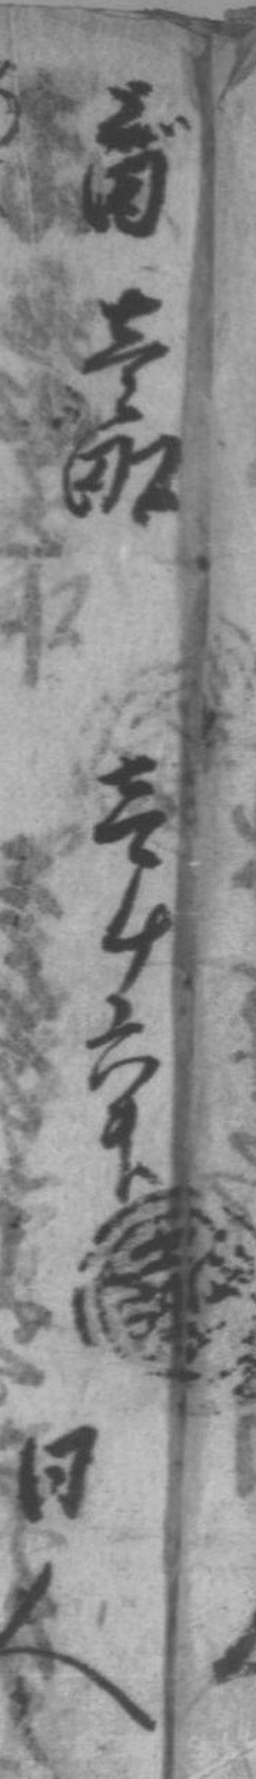上田壱畝壱斗六升同人
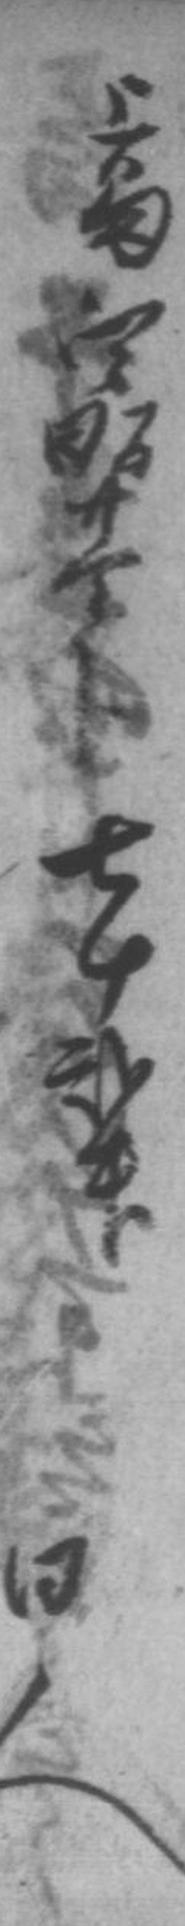上田四畝廿一分七斗弐升同人
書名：越州大野郡ノ内不動堂村御検地帳
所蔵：福井県文書館 Fukui Prefectural Archives
